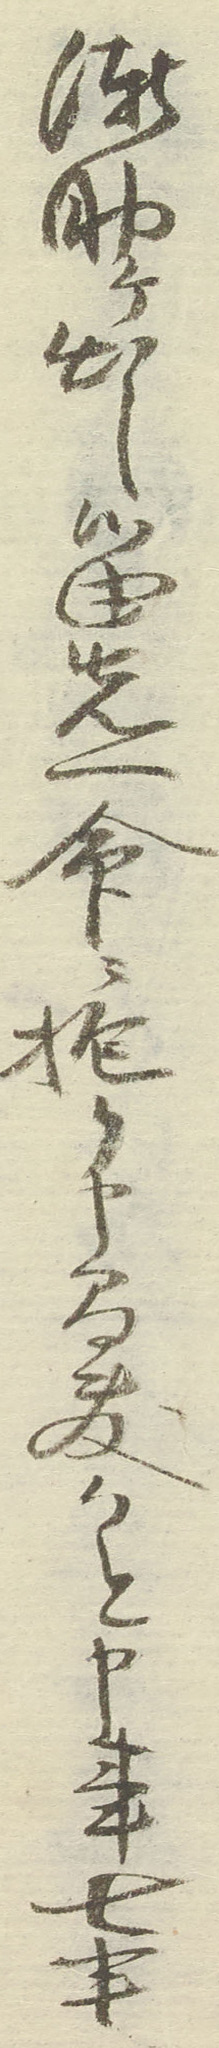漸く助ケ出し候由先一命ニ抱り申間敷かと申事七半
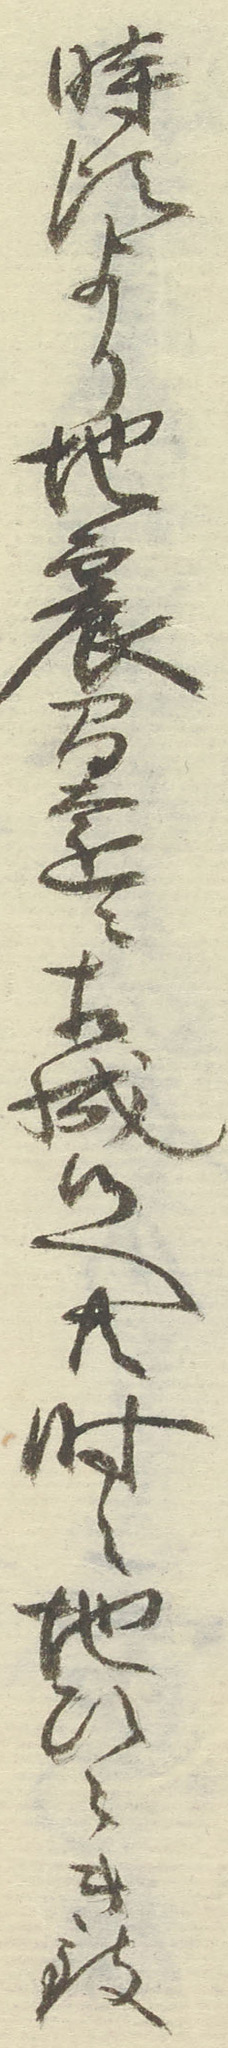時頃より地震間遠ニ相成候へ共時〻地ひゝき致
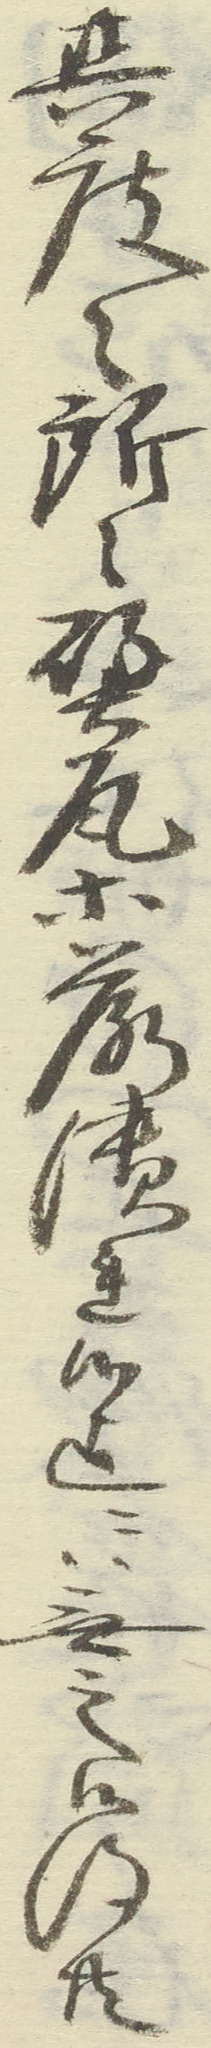其度〻所〻壁瓦抔落潰れ候迄ニハ無之候得共
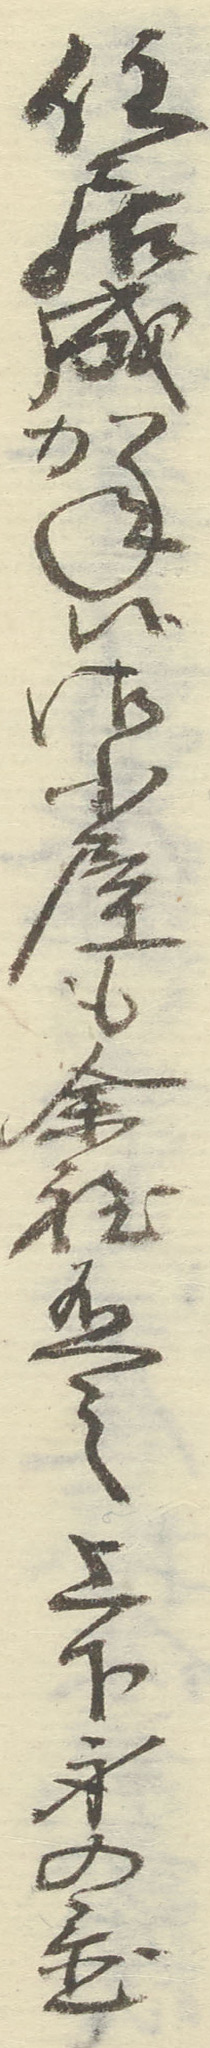住居成かね候御小屋も余程有之上下身の置
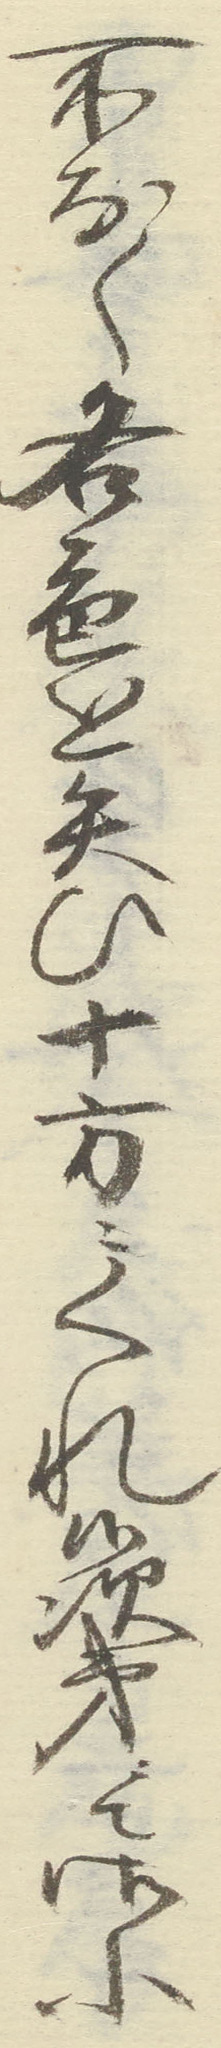所なく各色を失ひ十方ニくれ候次第ニて御小
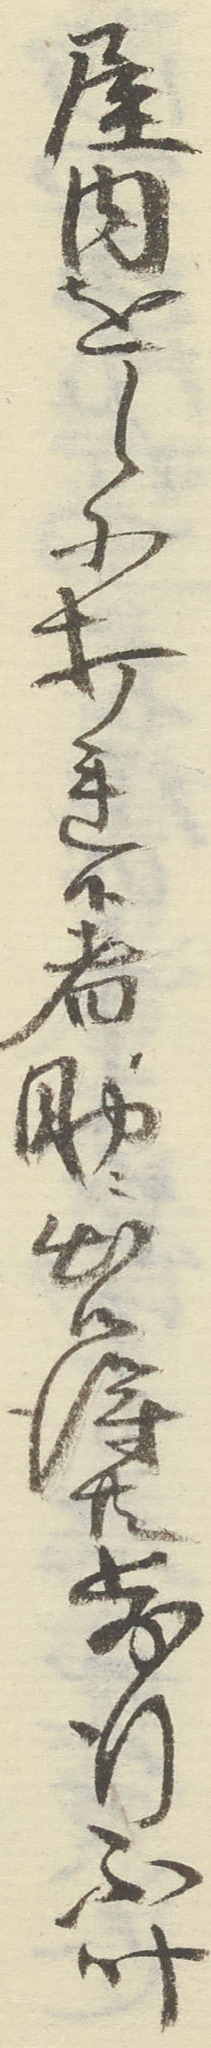屋内をしに打れ候者助ニ出候得共歩行不叶
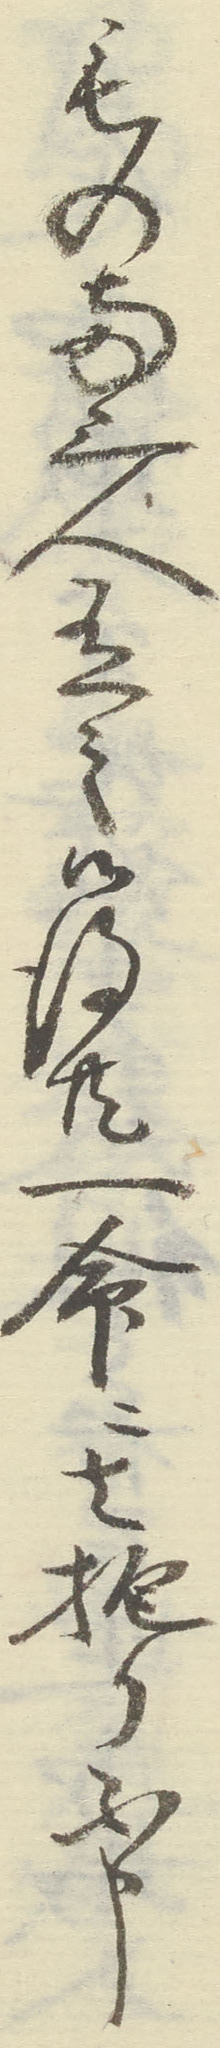もの両三人有之候得共一命ニは抱り不申
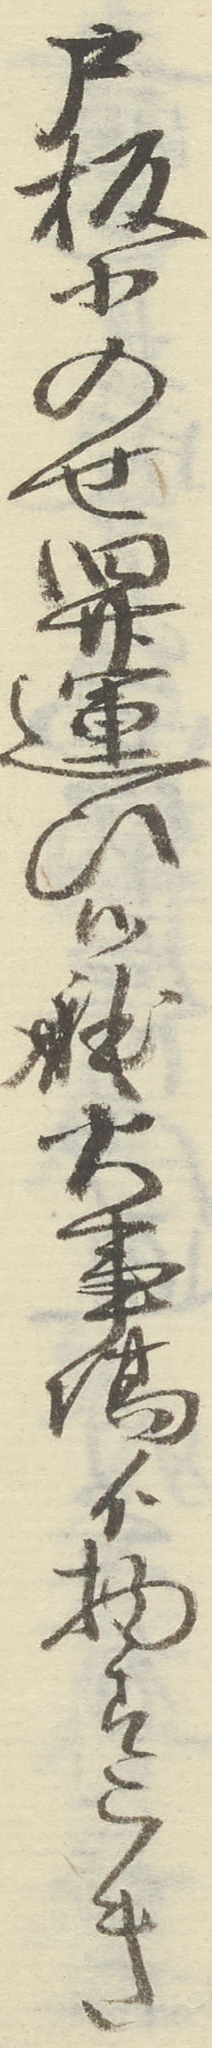戸板にのせ舁運ひ候躰火事場ゟ物すこき
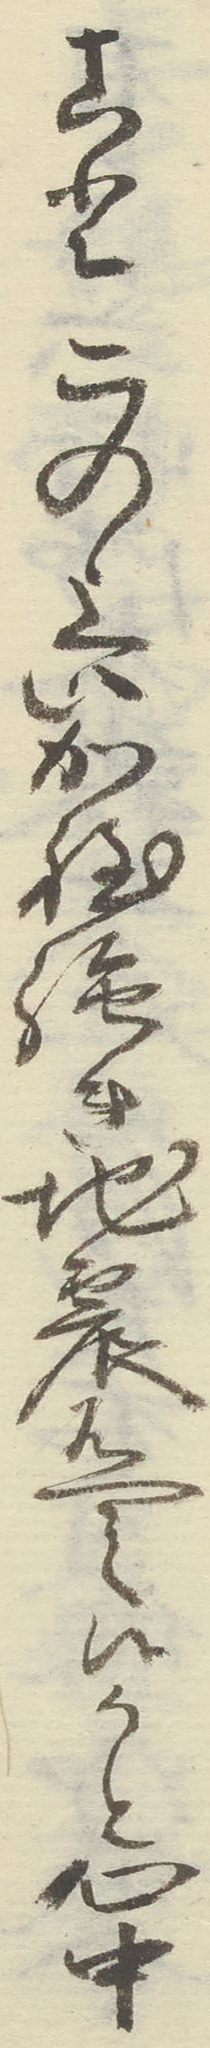ことこの上いか程強キ地震有之候かと心中
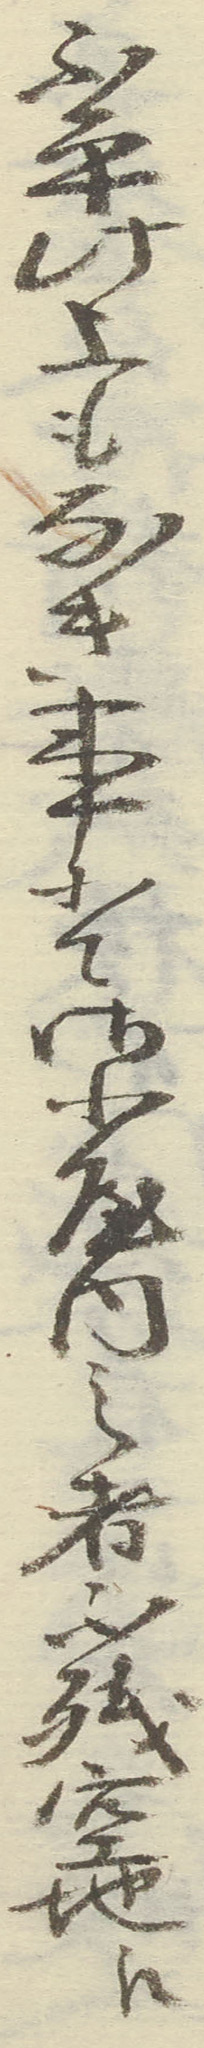不平此上もなき事にて御小屋内之者不残空地江
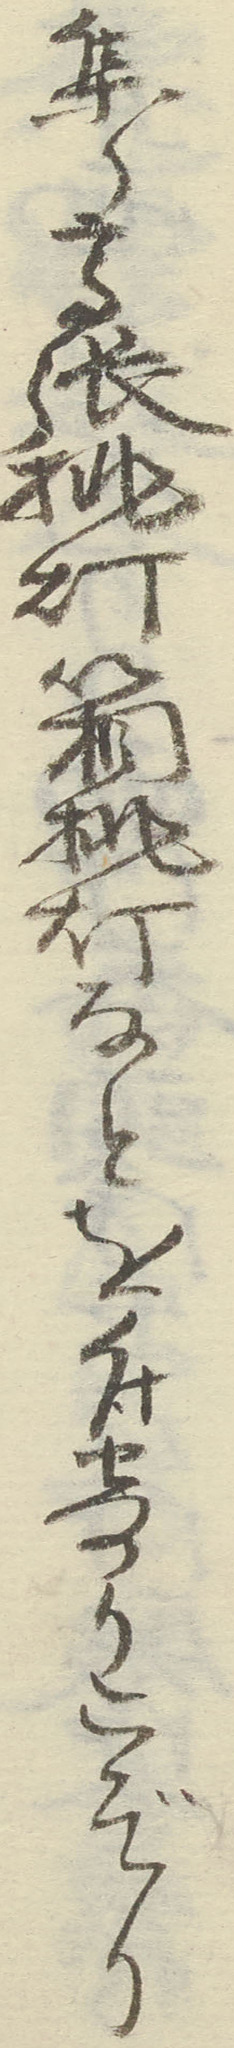集り高張挑灯箱提灯なとを付寄りこぞり
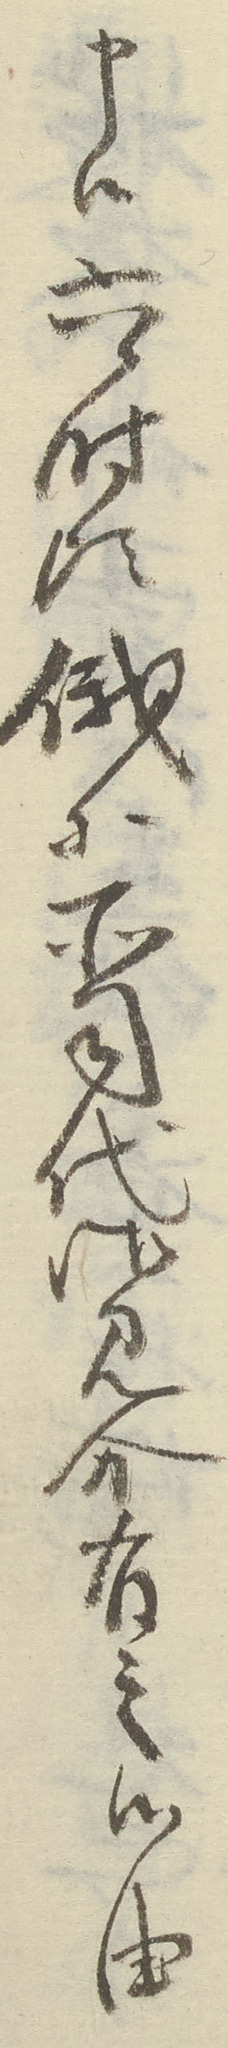申候六ツ時頃俄に所司代御見分有之候由

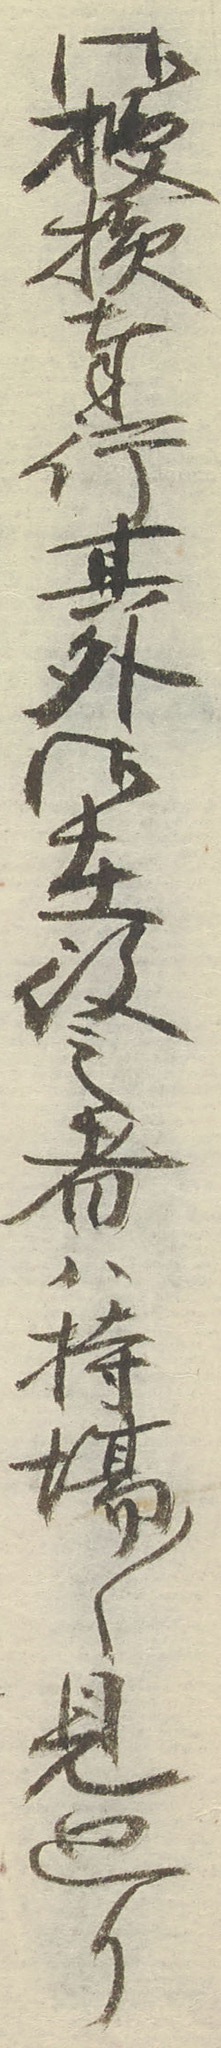御破損奉行其外御在役之者ハ持場〳〵見廻り
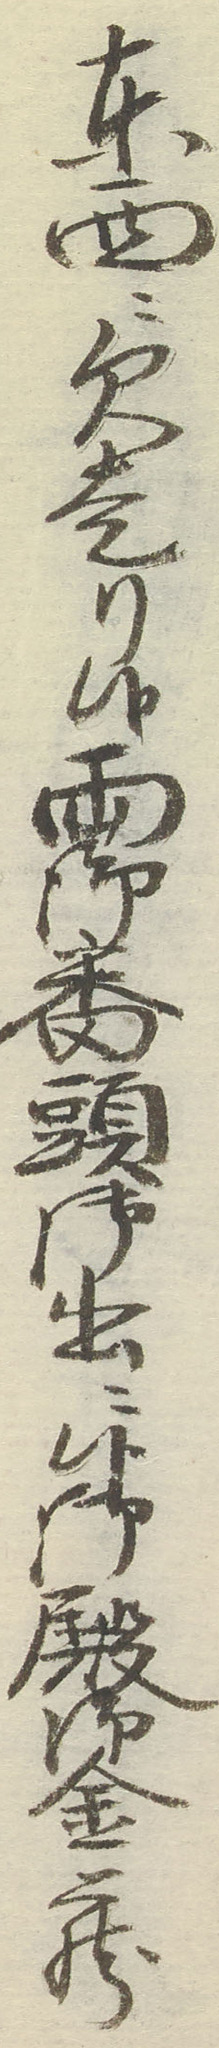東西ニ欠走り候両御番頭御出ニ候御殿御金蔵
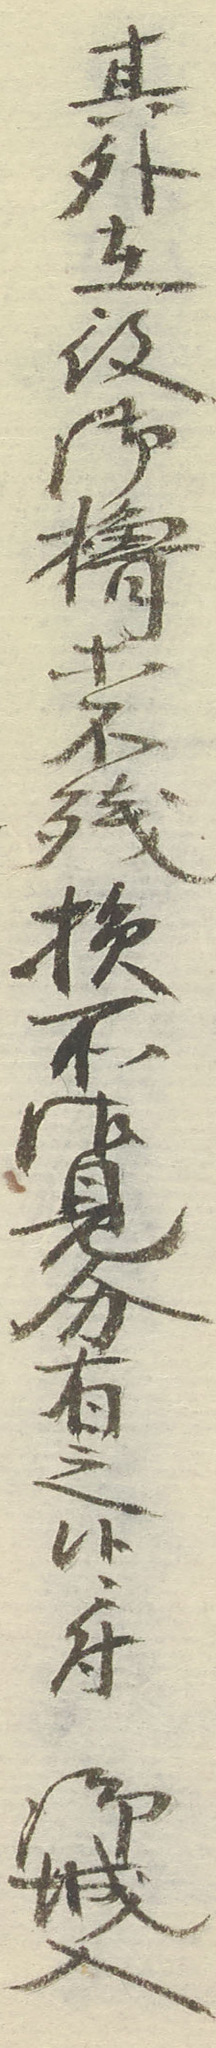其外在役御櫓抔不残損所御見分有之候ニ付御城入
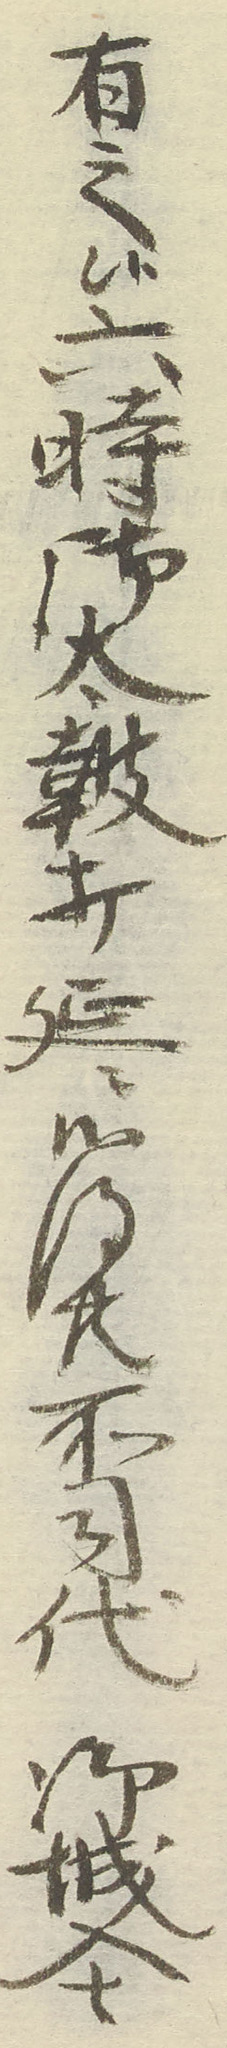有之候六時御太皷打延ニ候得共所司代御城入は
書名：[七月二日京都大地震に付御番衆大木市左衛門より申し越し候書面畧書状写]
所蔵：東京大学総合図書館 General Library in the University of Tokyo, JAPAN
